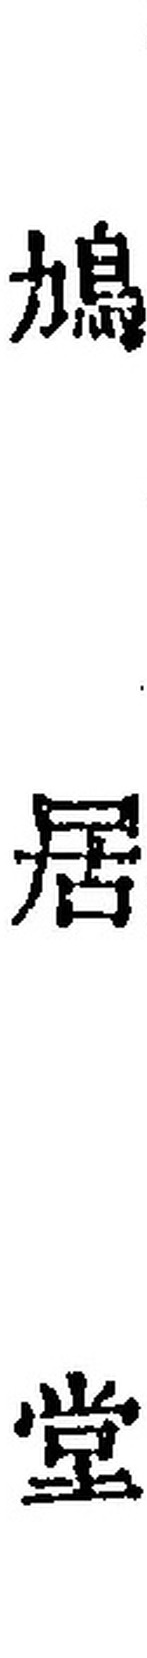鳩居堂
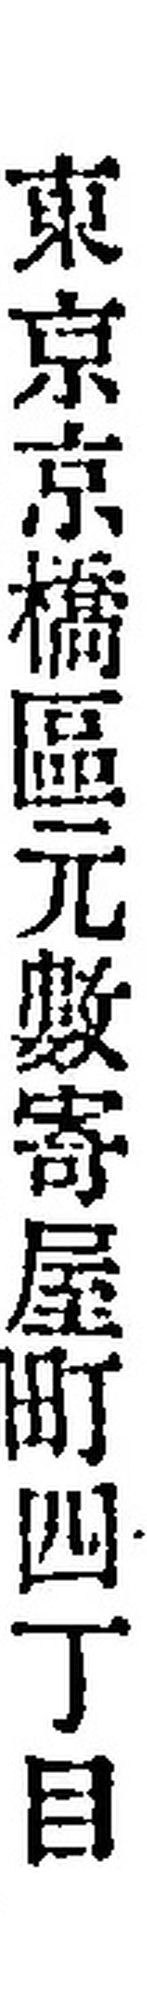印刷東京京橋區元數寄屋町四丁目
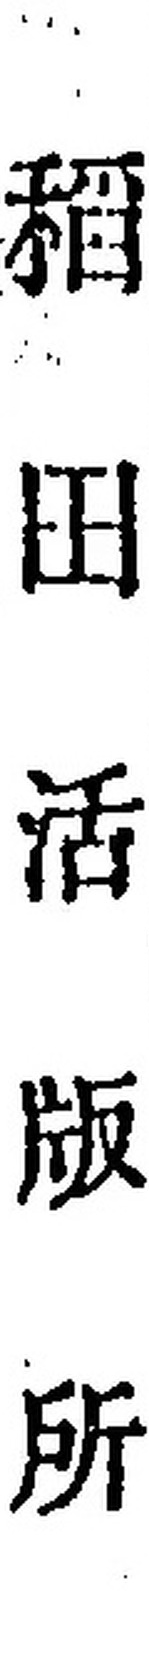稲田活版所

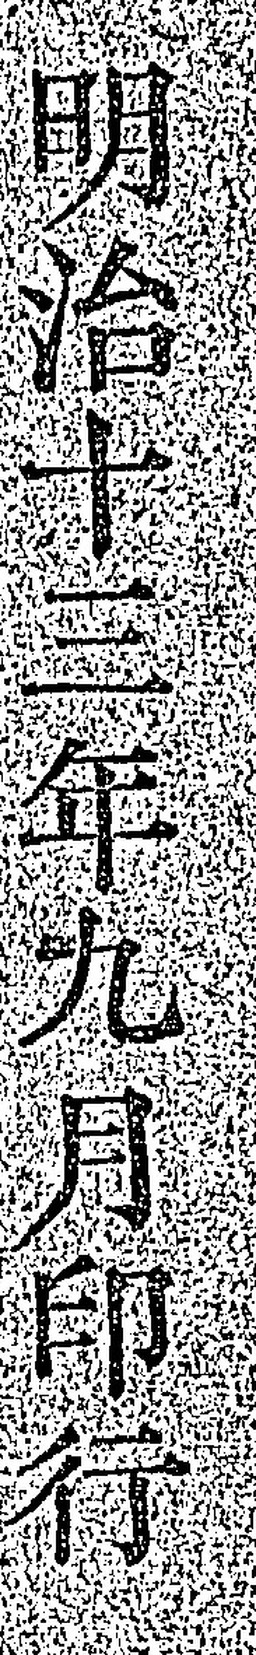明治十三年九月印行
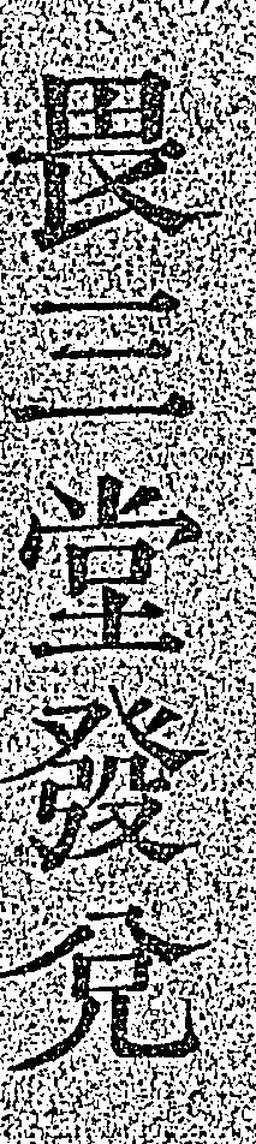畏三堂發兌
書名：飲水の心得 : 伝染病の予防
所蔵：国立国会図書館 National Diet Library, JAPAN
